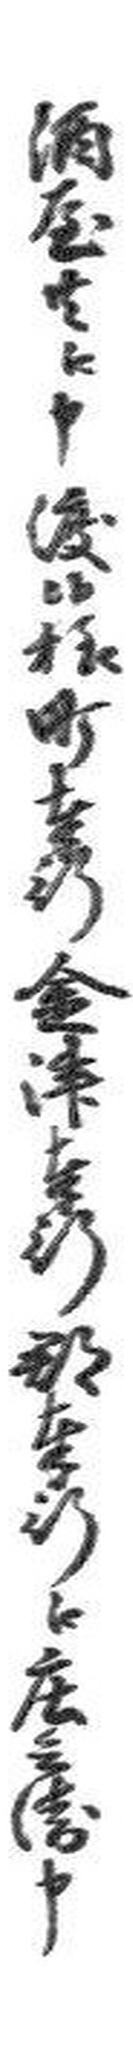酒屋共江申渡候様町奉行金津奉行郡奉行江庄兵衛申
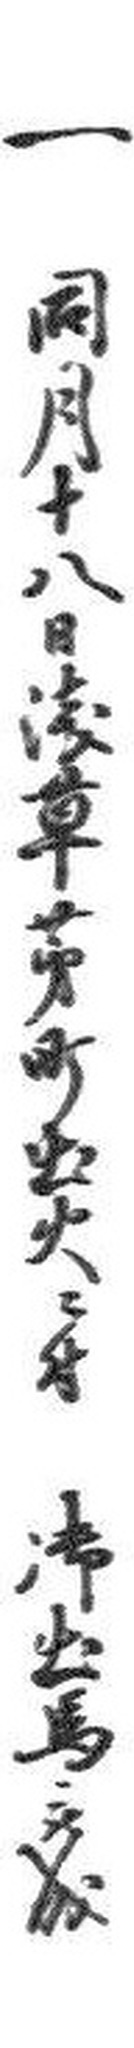一同月十八日浅草茅町出火ニ付御出馬被成

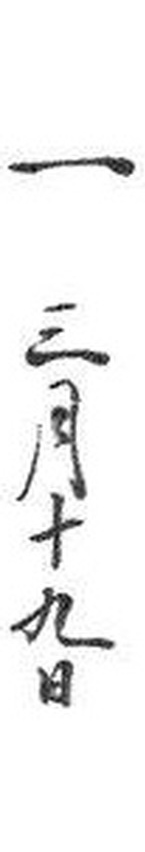一三月十九日
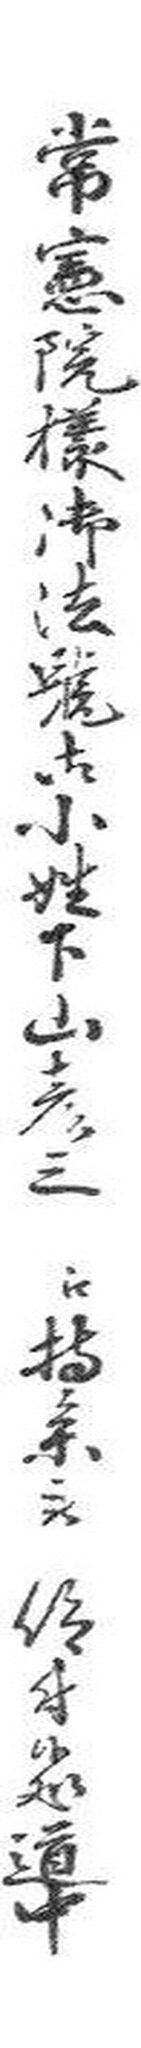常憲院様御法号御小姓下山彦三江持参被仰付候処道中
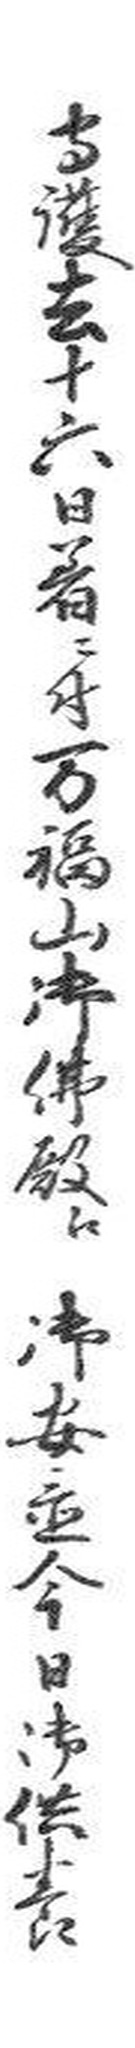守護去十六日着ニ付万福山御仏殿江御安置今日御供養
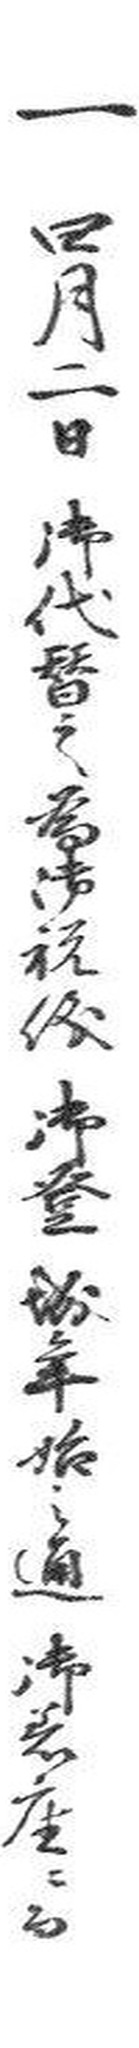一四月二日御代替之為御祝儀御登城年始之通御着座ニ而
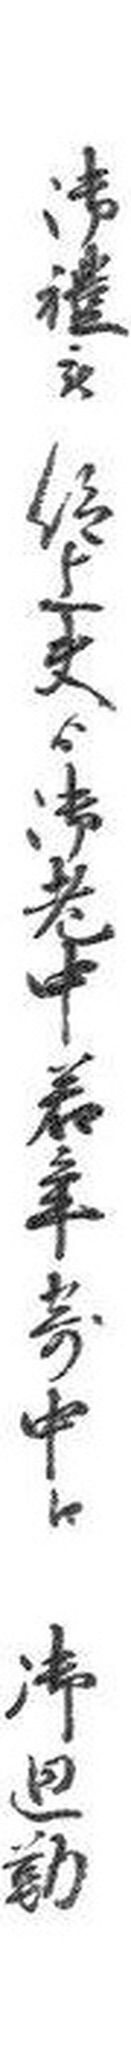御礼被仰上夫ゟ御老中若年寄中江御廻勤
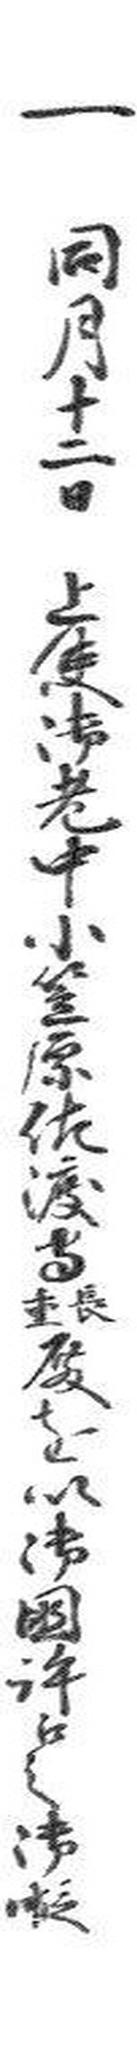一同月十二日上使御老中小笠原佐渡守長重殿を以御国許江之御暇
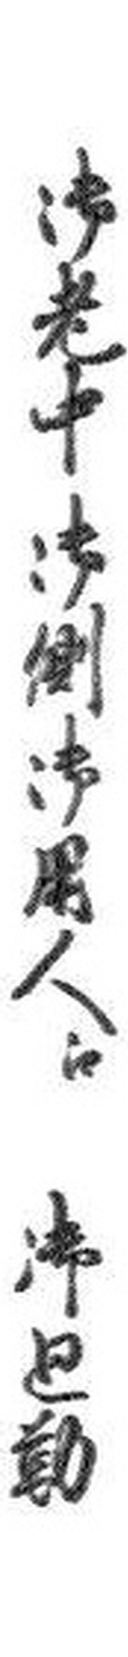御老中御側御用人江御廻勤
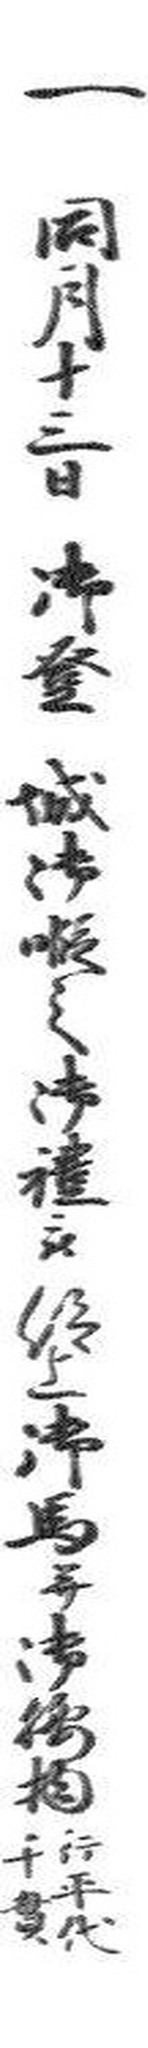一同月十三日御登城御暇之御礼被仰上御馬幷御腰物行平代千貫
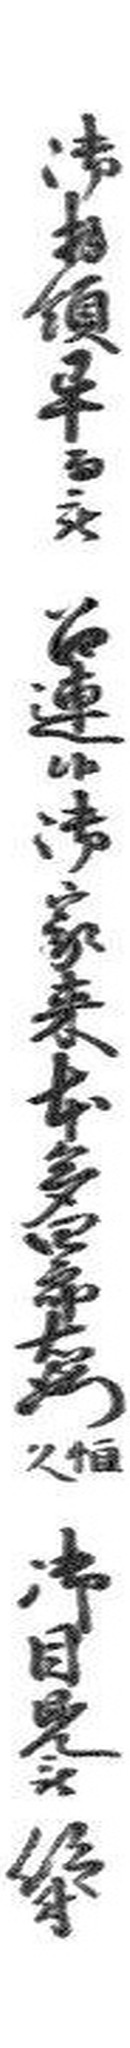御拝領畢而被召連候御家来本多四郎右衛門恒久御目見被仰付
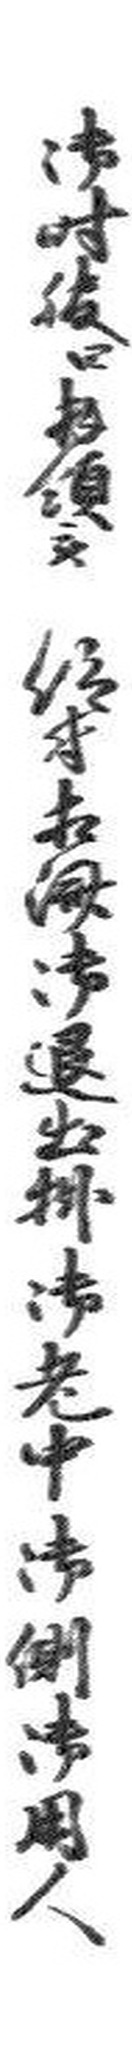御時服四拝領被仰付相済御退出掛御老中御側御用人
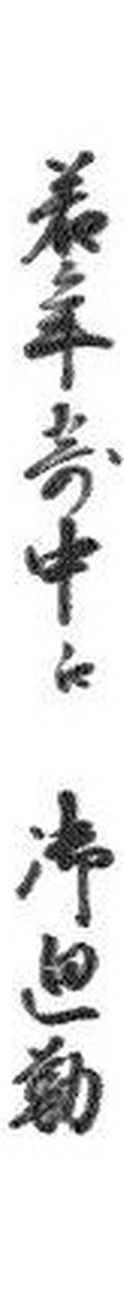若年寄中江御廻勤
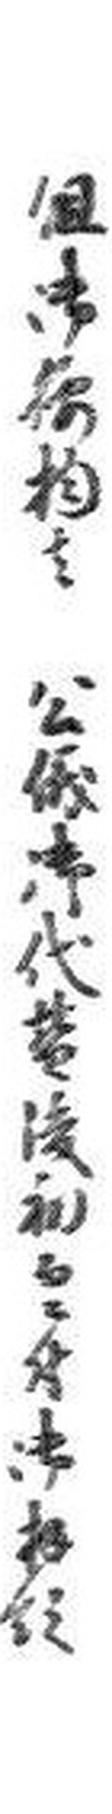但御腰物者公儀御代替後初而ニ付御拝領
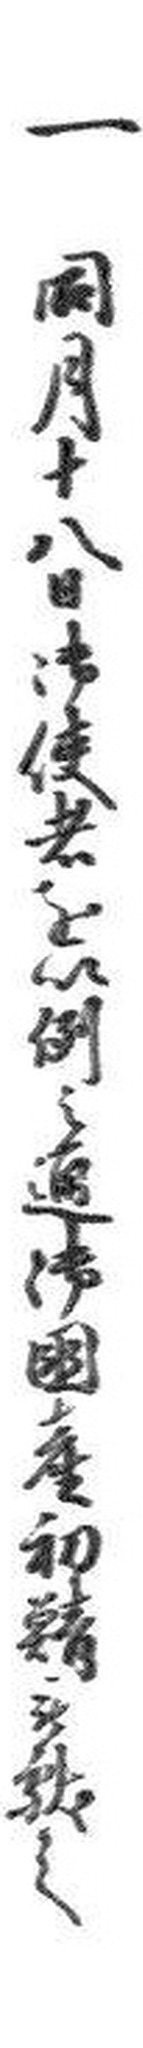一同月十八日御使者を以例之通御国産初鯖被献之
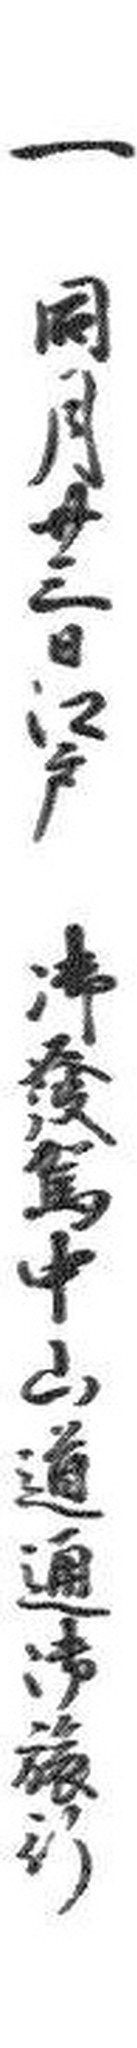一同月廿三日江戸御発駕中山道通御旅行
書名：家譜 二十五 吉品公 従宝永六年到同七年
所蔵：福井県文書館 Fukui Prefectural Archives
